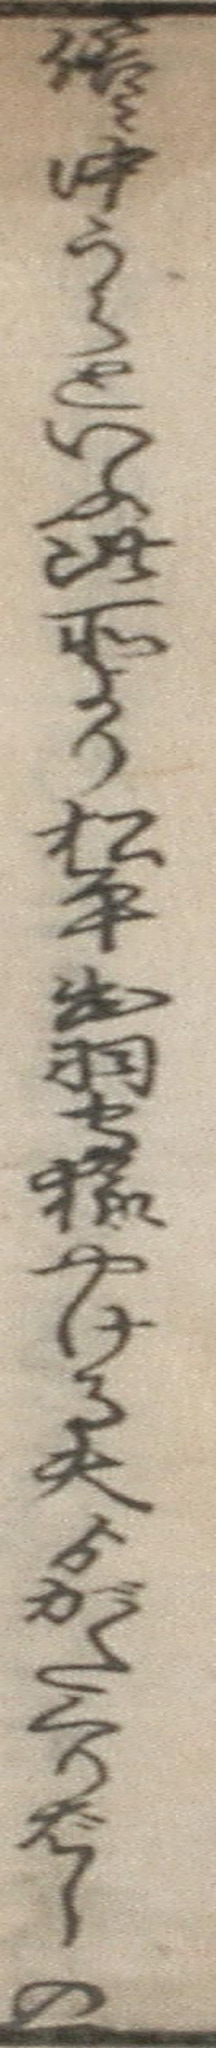俗に中うらといふ此所より松平出羽守様やける夫ゟがたくりばしの
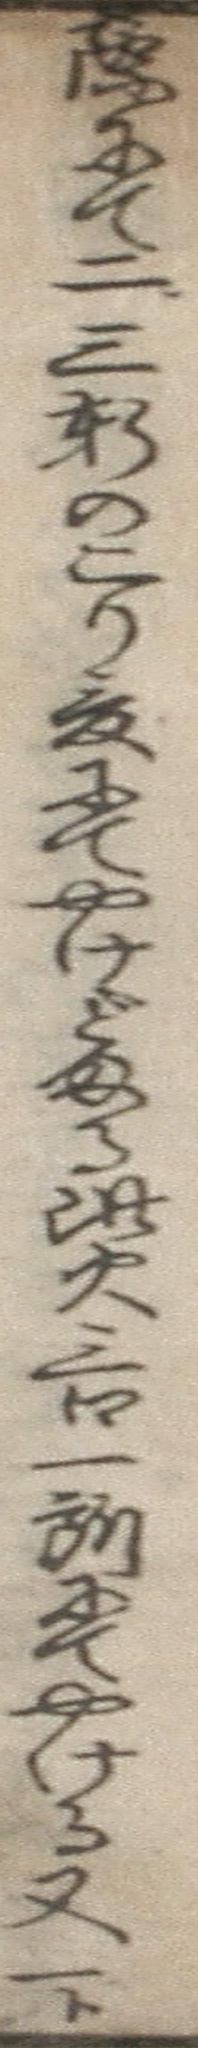際にて二三軒のこり爰にてやけどまる此火三口一所にてやける又一ト
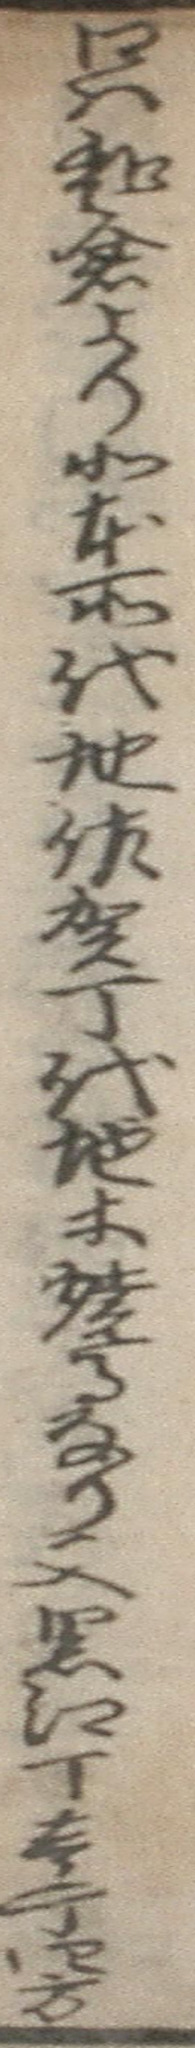口は和倉より北本所代地佐賀丁代地等焼るなり又黒江丁壱丁四方
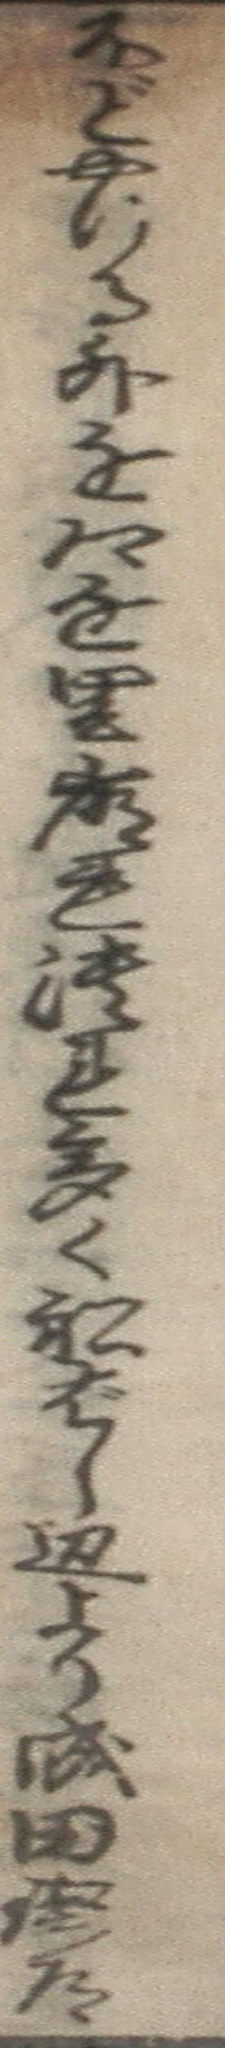ほどやける外近郷近里崩れ潰れ多く船ばし辺より成田街？道
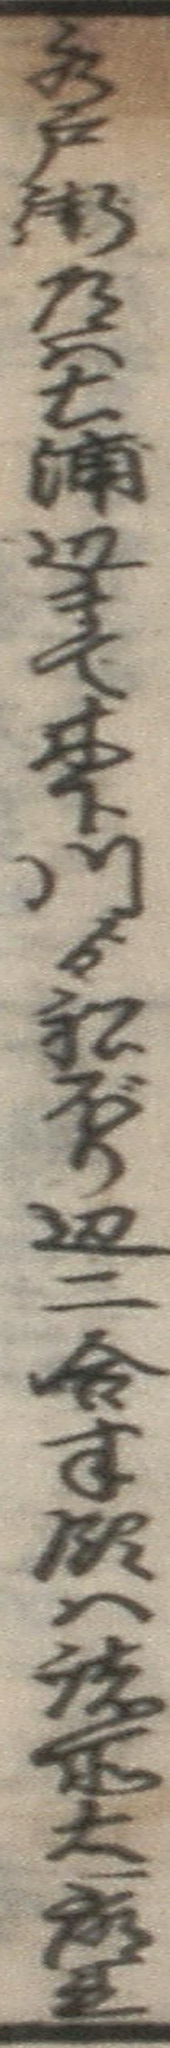水戸街道は土浦辺まて木下川ゟ船ぼり辺二合半餘は諸所大崩れ
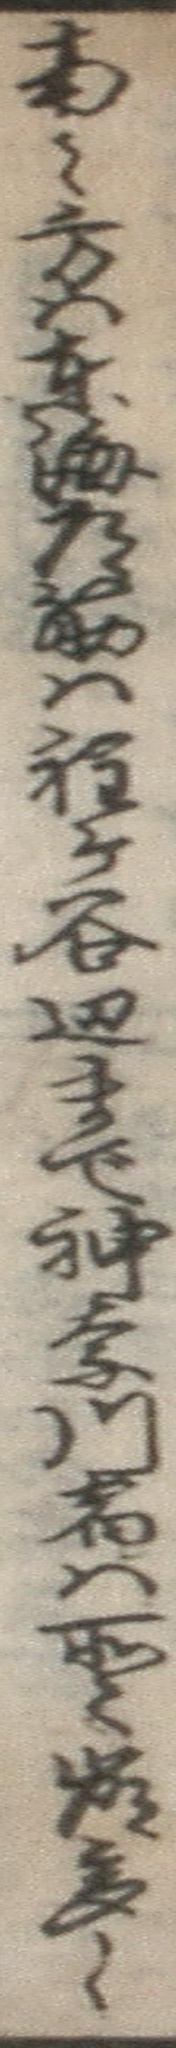南之方は東海道筋は程ヶ谷辺まで神奈川宿は所〻崩多し
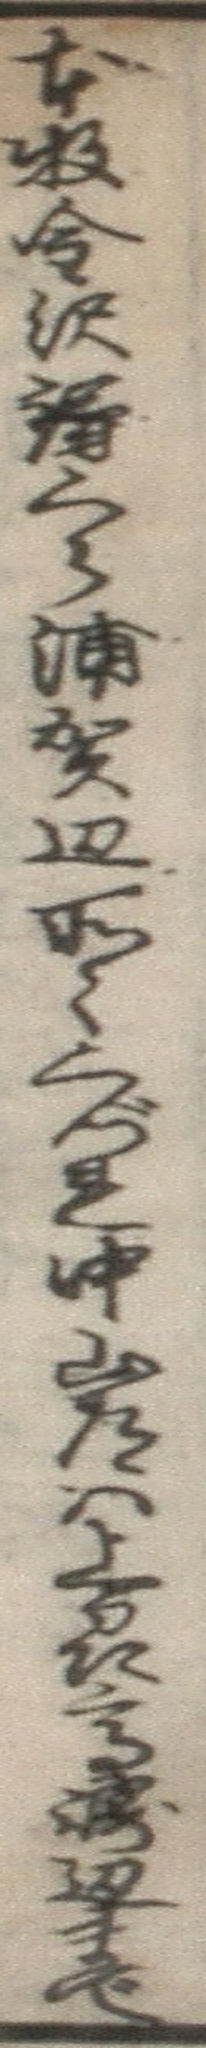本牧金沢鎌くら浦賀辺所〻くづれ中山道は上州高崎辺まで
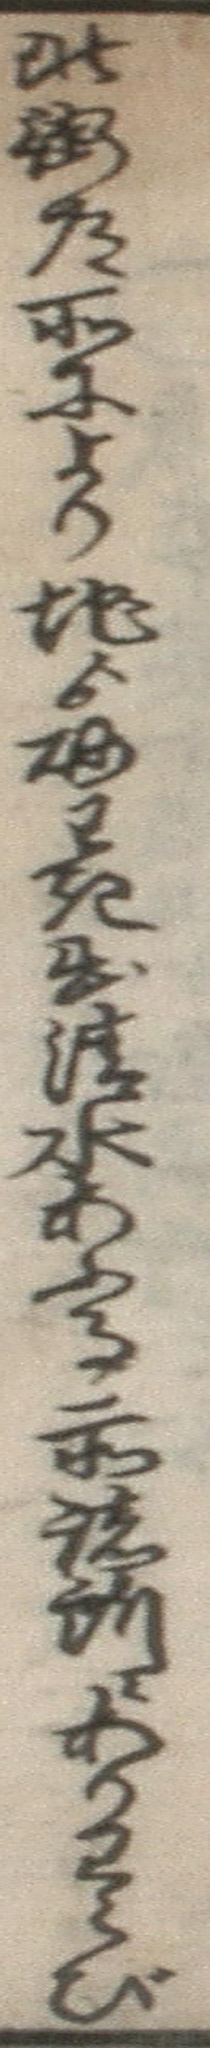此街道所により地ゟ砂わき出清水あふるゝ所諸所にありわらび
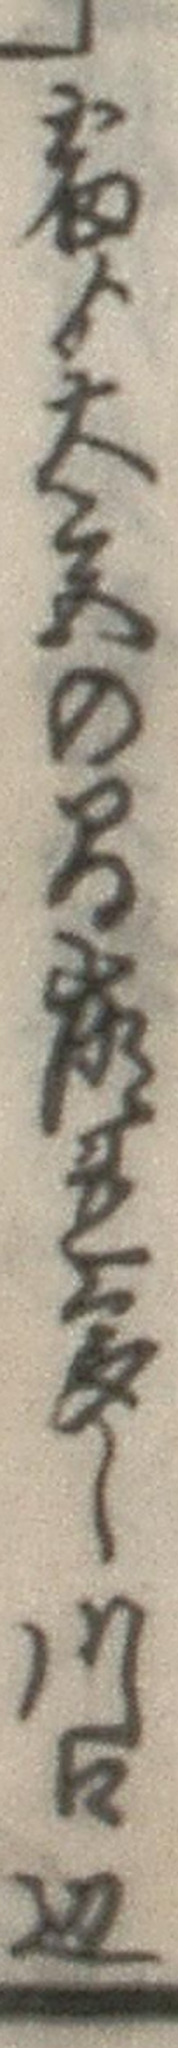宿ゟ大宮の間崩れ多し川口辺
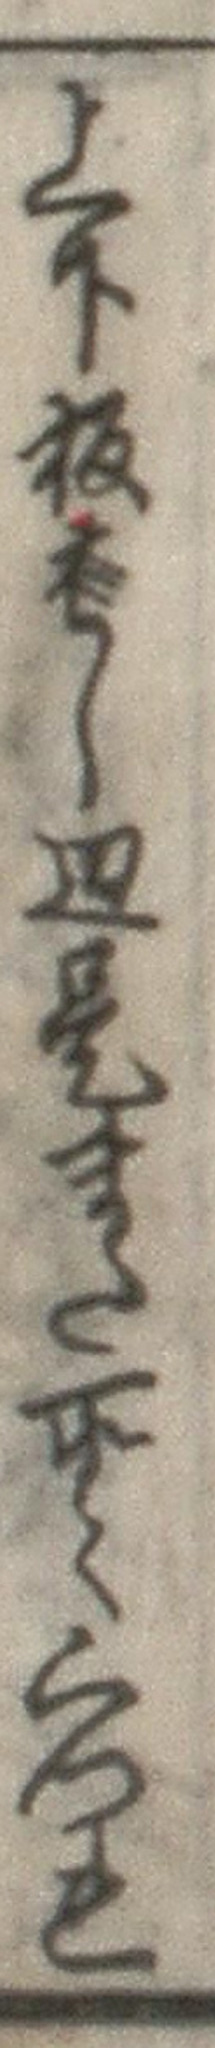上下板ばし辺是また所〻くつれ
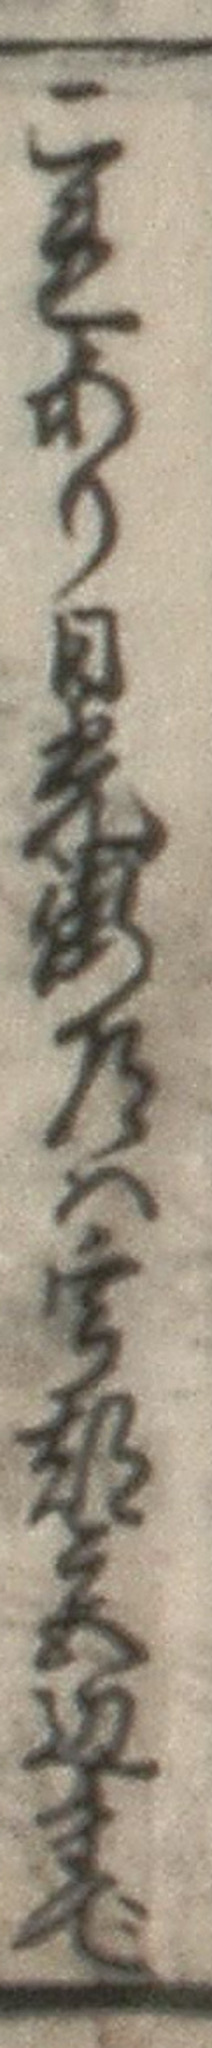これあり日光街道は宇都宮辺まで
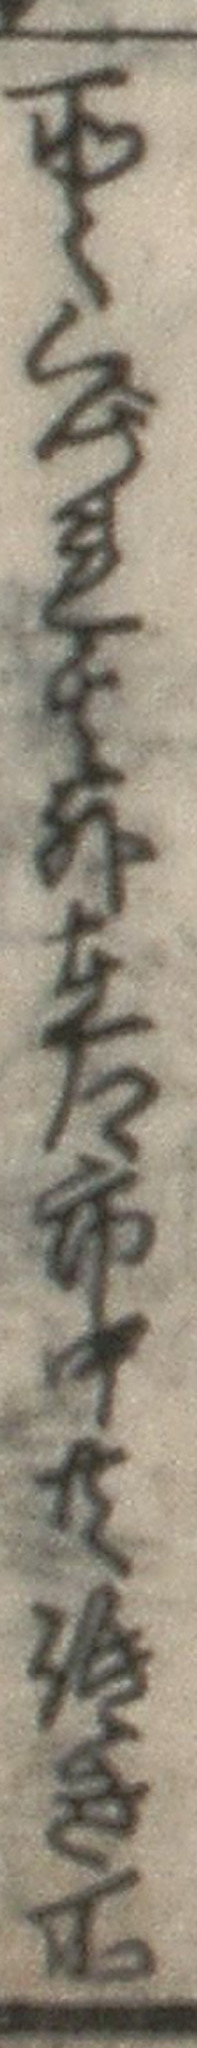所〻くづれ其外在郷市中共低き所
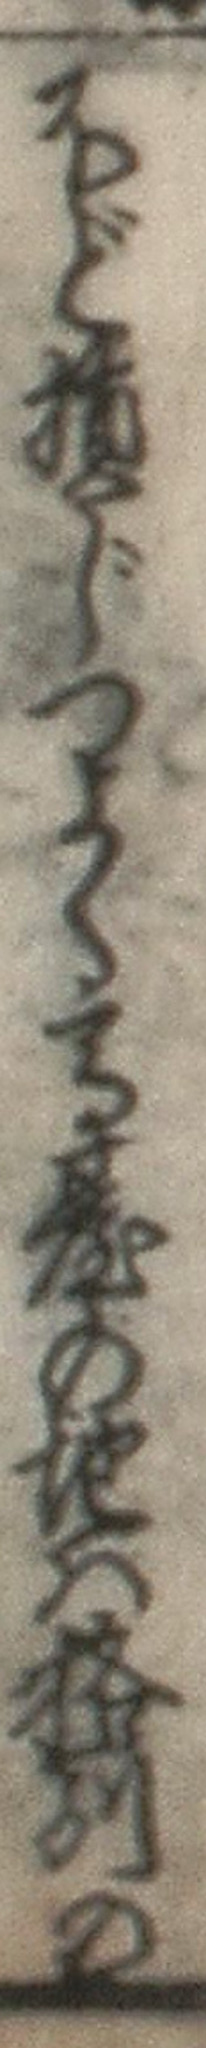ほど損じつよく高台の地は格別の
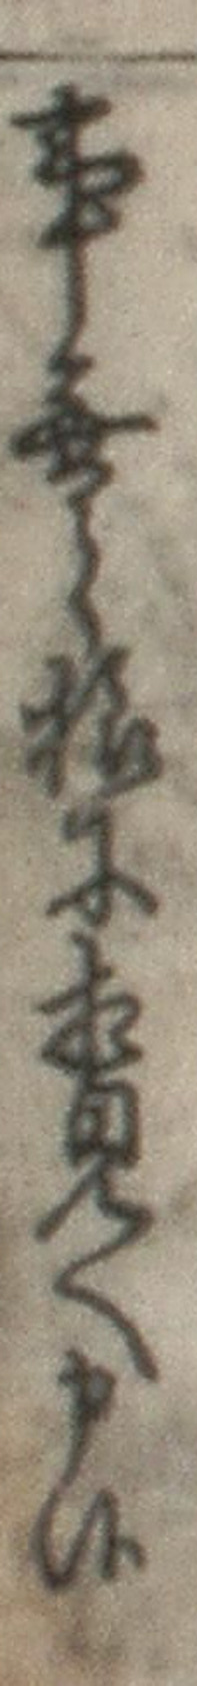事無之様に相見へ申候

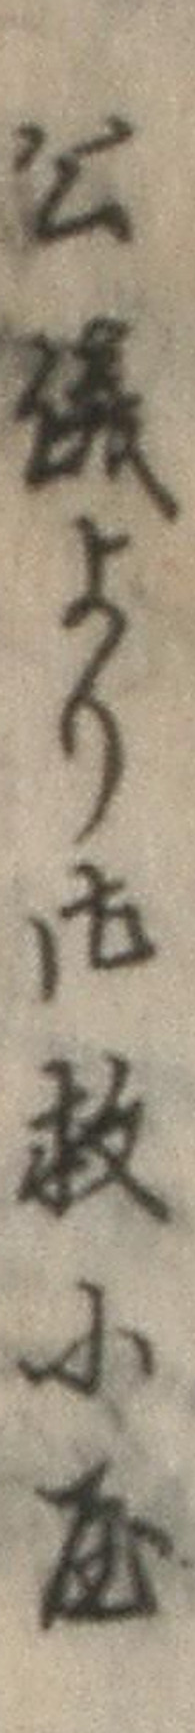公儀より御救小屋
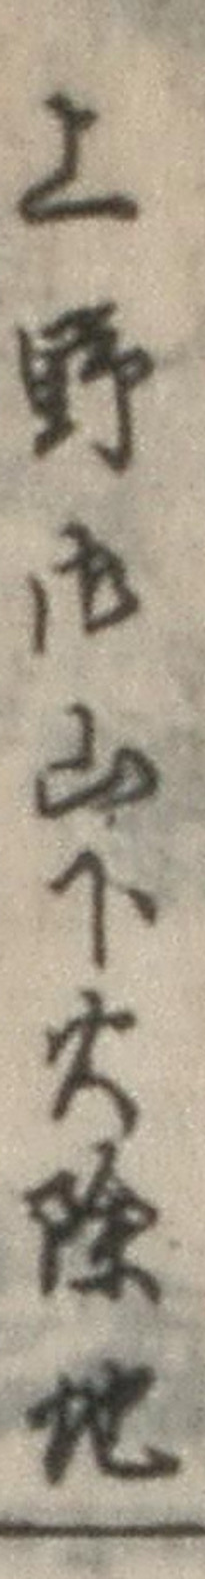上野御山下火除地
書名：江戸大地震末代鑑
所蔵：東京大学地震研究所図書室 Earthquake Research Institute Library, The University of Tokyo, JAPAN
